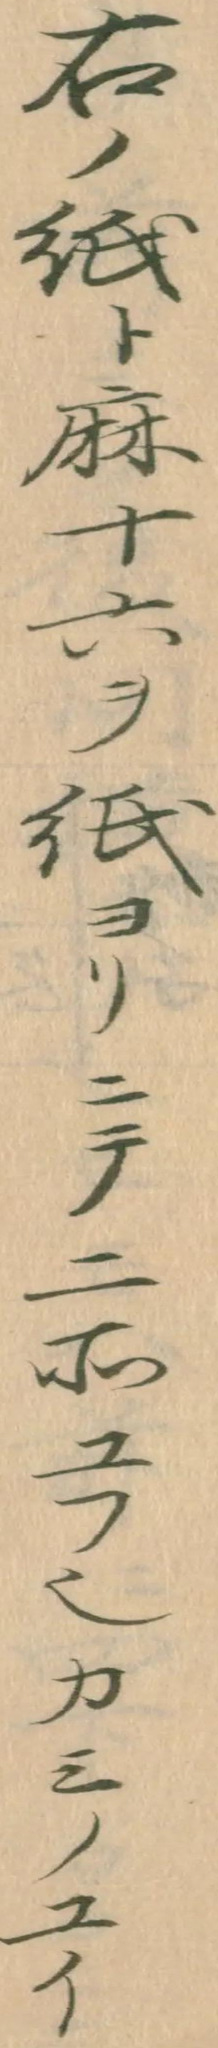右ノ紙ト麻十六ヲ紙ヨリニテ二所ユフ也カミノユイ
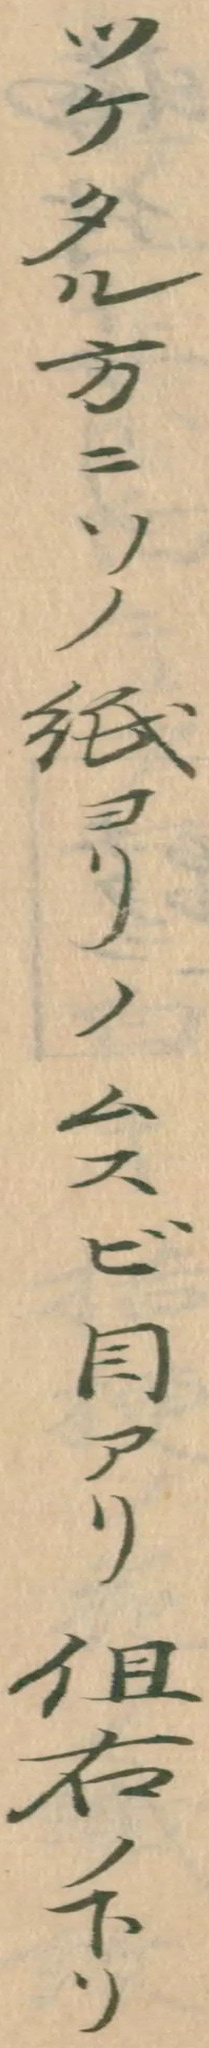ツケタル方ニソノ紙ヨリノムスビ目アリ但右ノ下リ
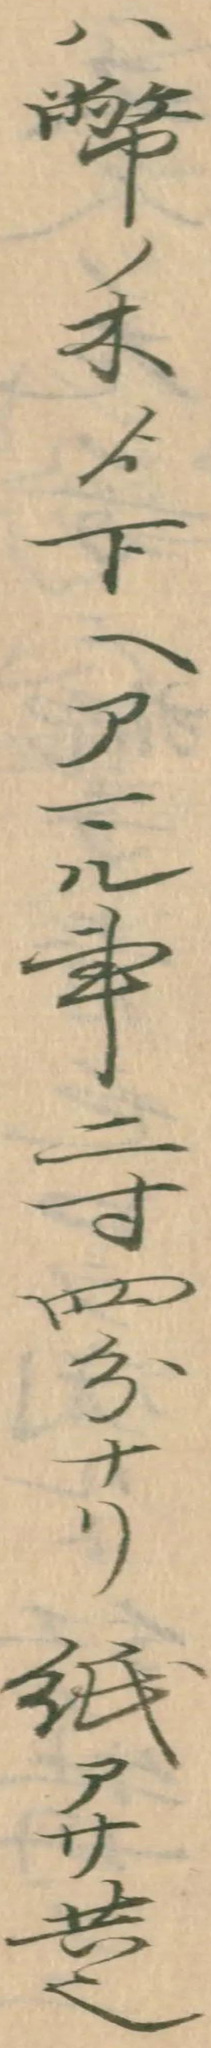ハ幣ノ木ゟ下ヘアマル事二寸四分ナリ紙アサ共也
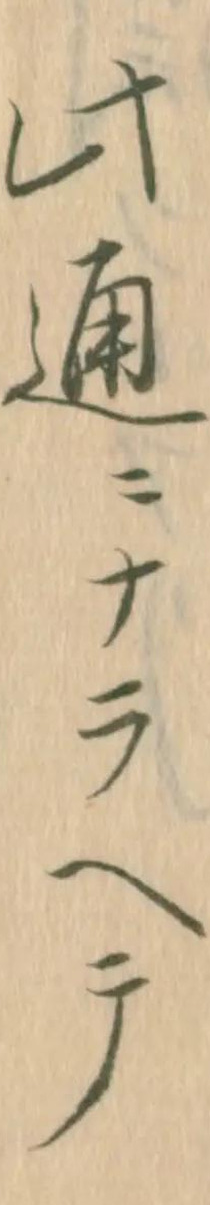此通ニナラヘテ
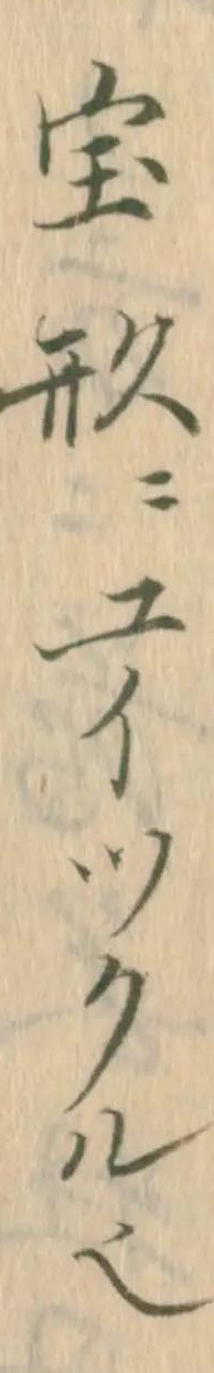宝形ニユイツクル也
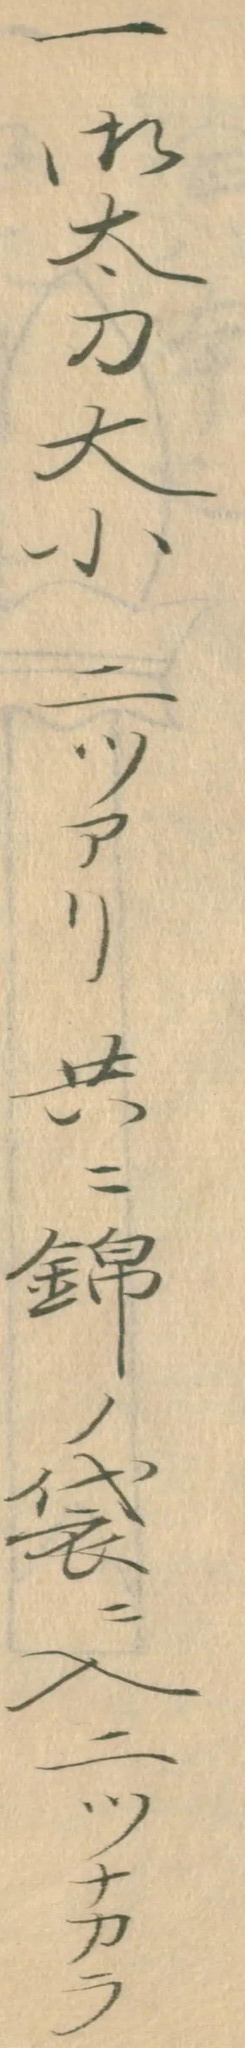一御太刀大小二ツアリ共ニ錦ノ袋ニ入二ツナカラ
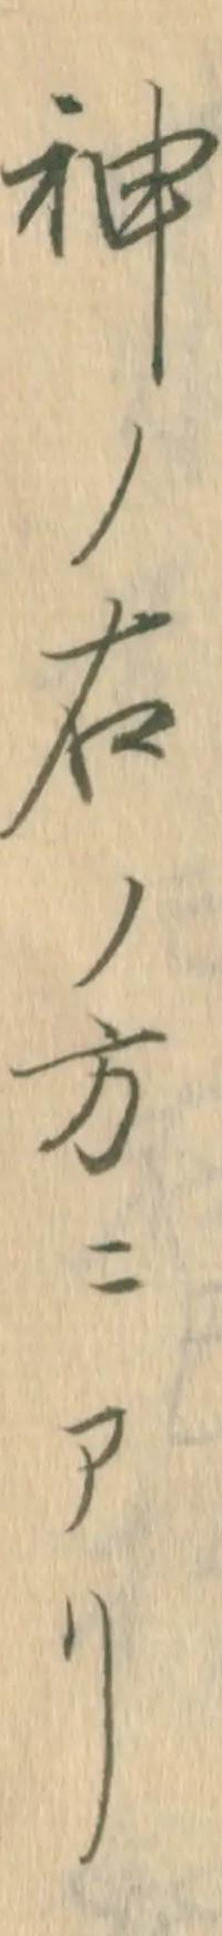神ノ右ノ方ニアリ
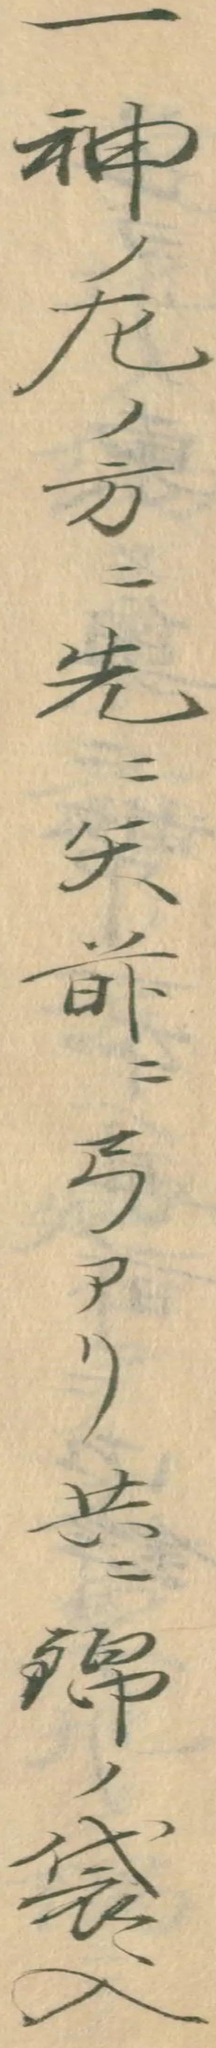一神ノ左ノ方ニ先ニ矢前ニ弓アリ共ニ錦ノ袋ヘ入

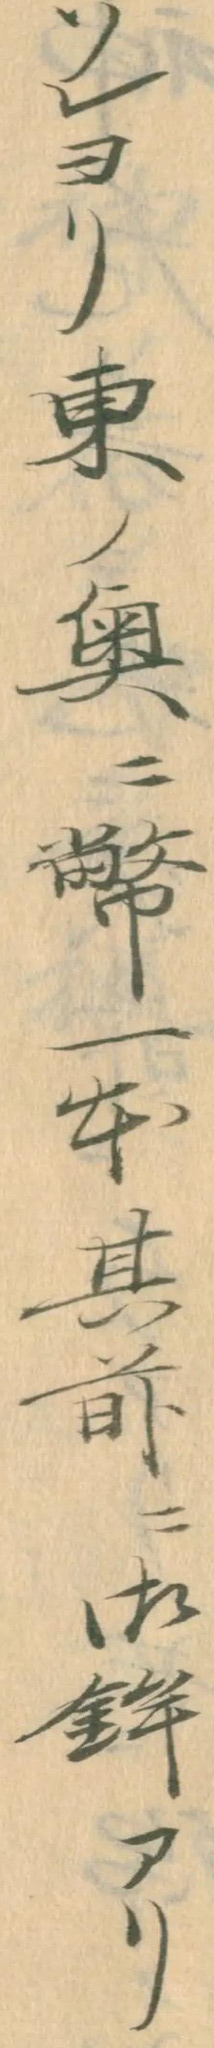ソレヨリ東ノ奥ニ幣一本其前ニ御鉾アリ
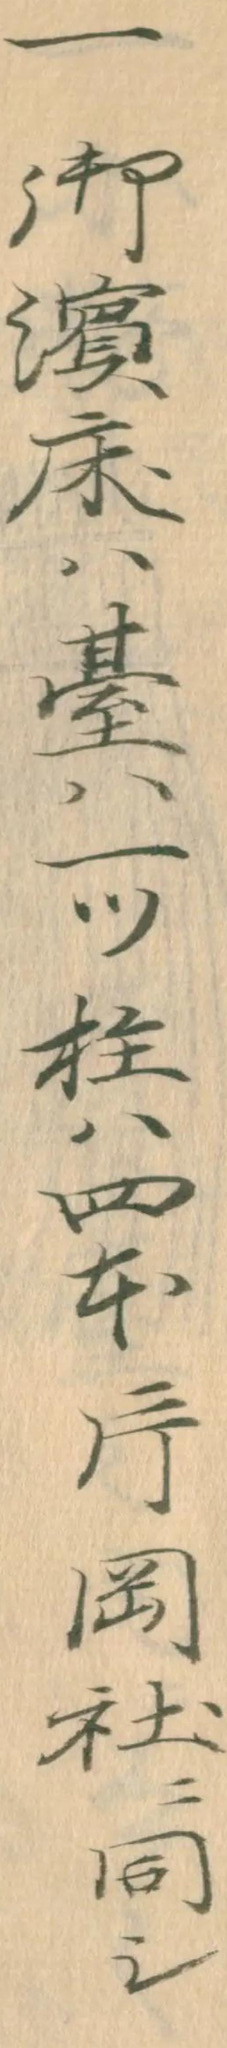一御浜床ハ台ハ一ツ柱ハ四本片岡社ニ同シ
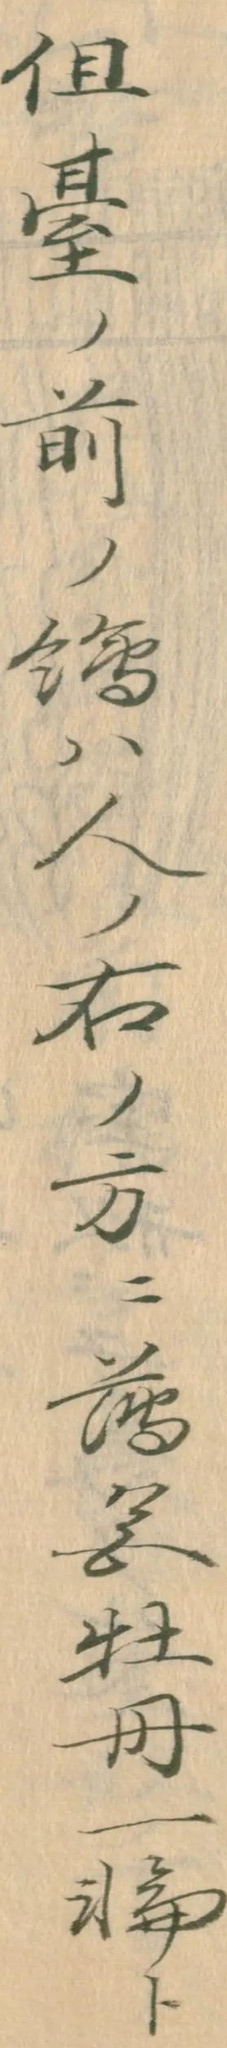但台ノ前ノ絵ハ人ノ右ノ方ニ薄色牡丹一輪ト
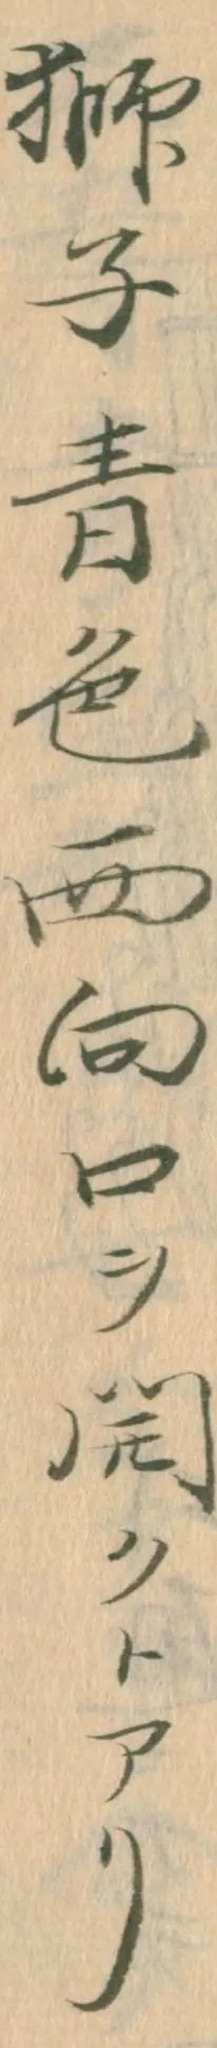獅子青色西向口ヲ開クトアリ
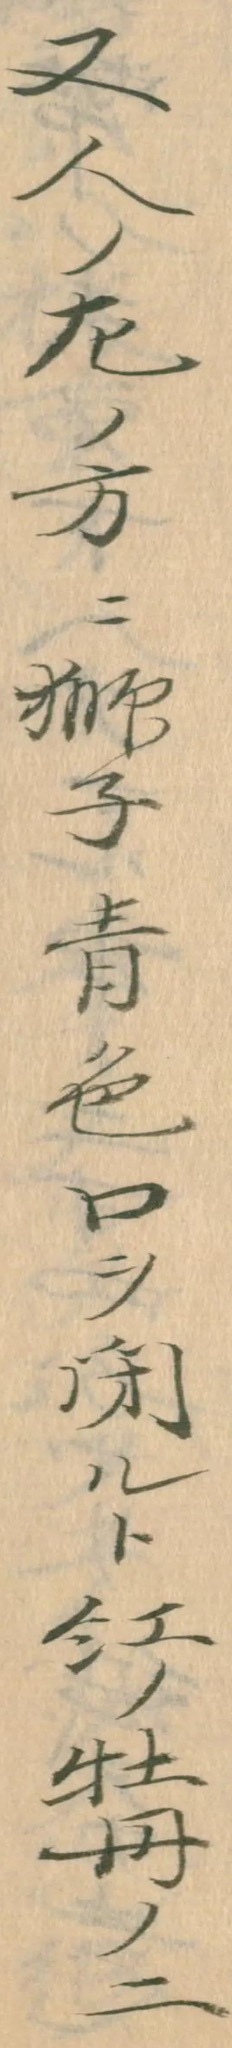又人ノ左ノ方ニ獅子青色口ヲ閉ルト紅ノ牡丹ノ二
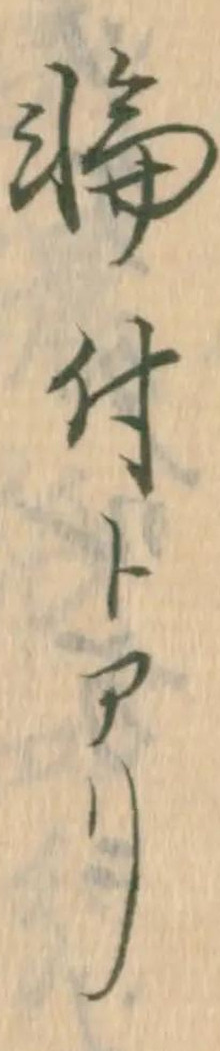輪付トアリ
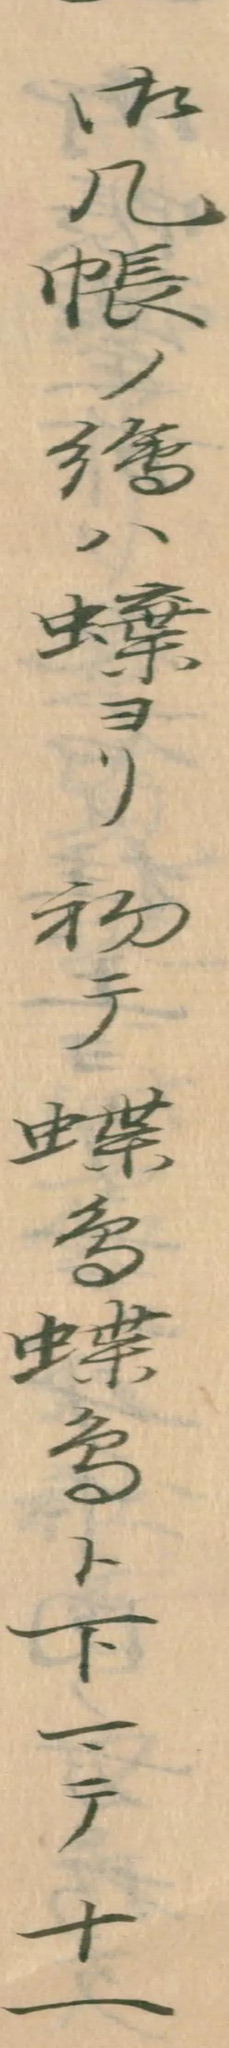一御几帳ノ絵ハ蝶ヨリ初テ蝶鳥蝶鳥ト下マテ十一
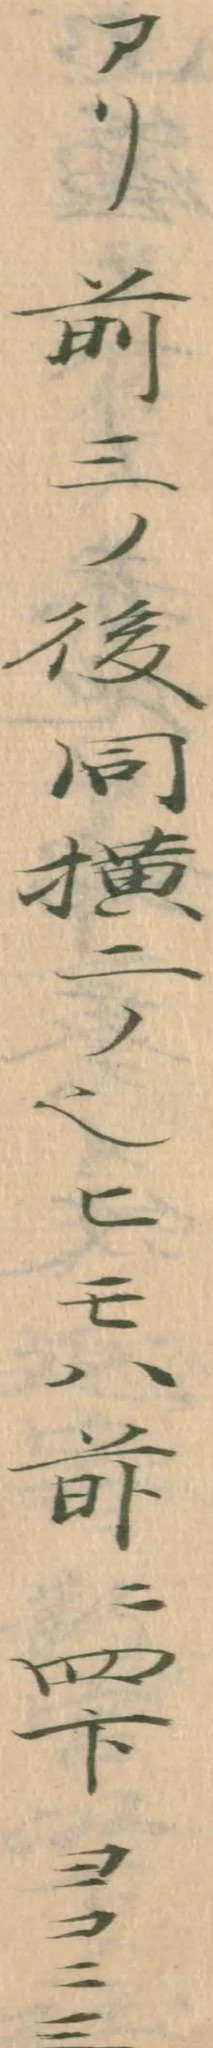アリ前三ノ後同横二ノ也ヒモハ前ニ四下ヨコニ三
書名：賀茂社記録. 第15冊
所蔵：国立国会図書館 National Diet Library, JAPAN
